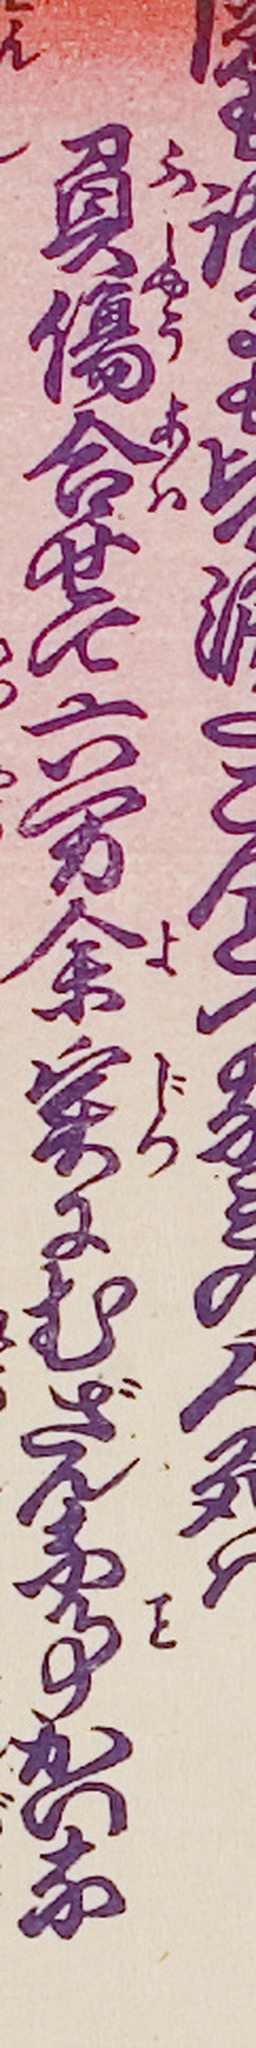負傷合せて六万余実にむざんな事かいな
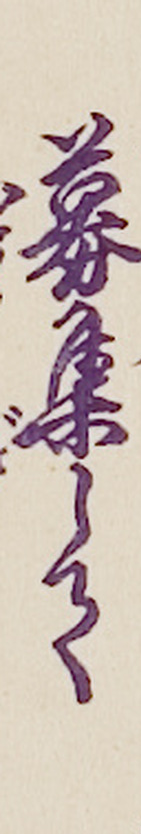募集して
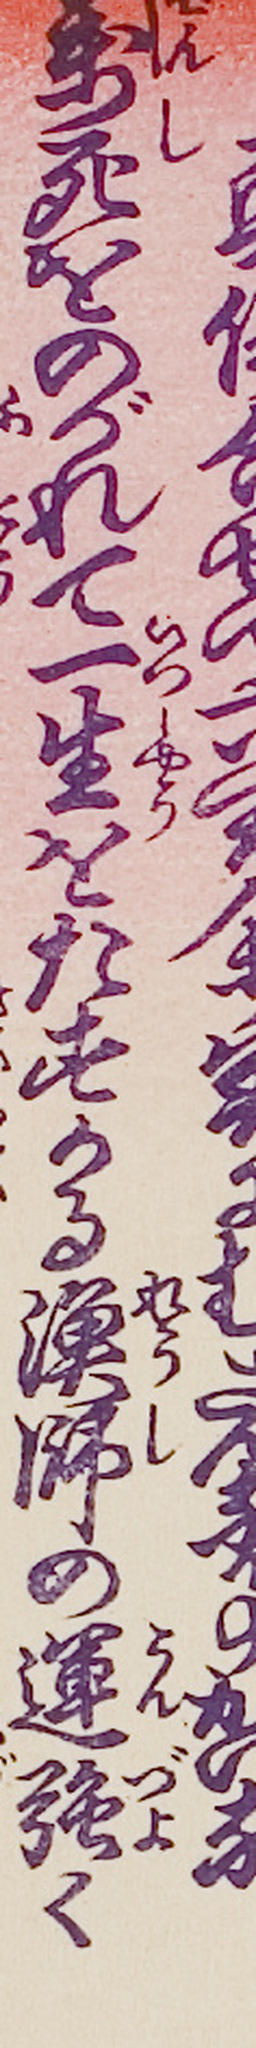〽万死をのがれて一生をたすかる漁師の運強く
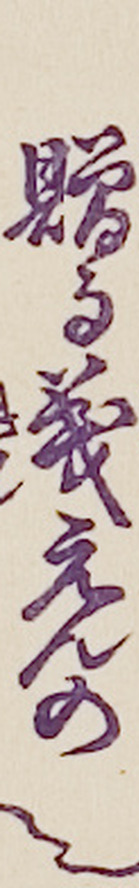贈る義えんの
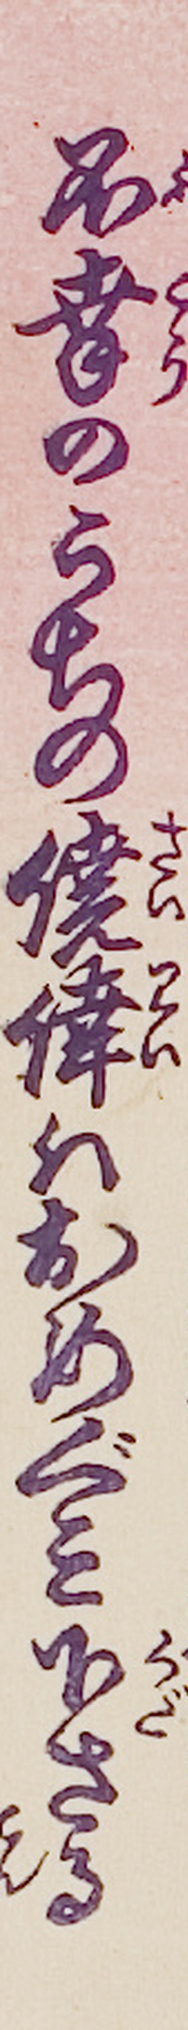不幸のうちの僥倖はおめぐみ下さる
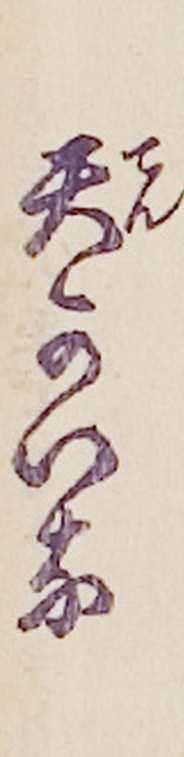天かいな
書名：北陸三県大つなみ縁かいな節
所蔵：東京大学総合図書館 General Library in the University of Tokyo, JAPAN
